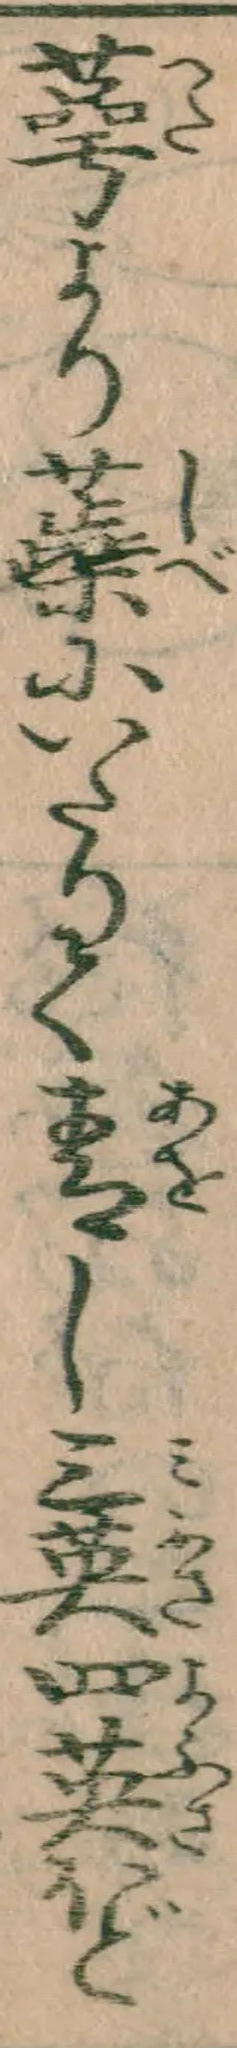蕚より蘂にいたりて青し三英四英ほど
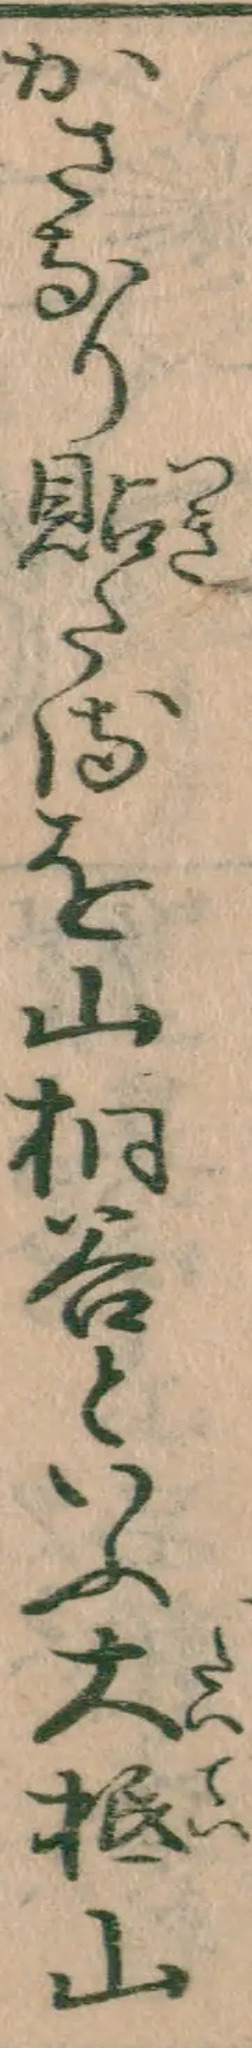かさなり貼たるを山桐谷といふ大抵山
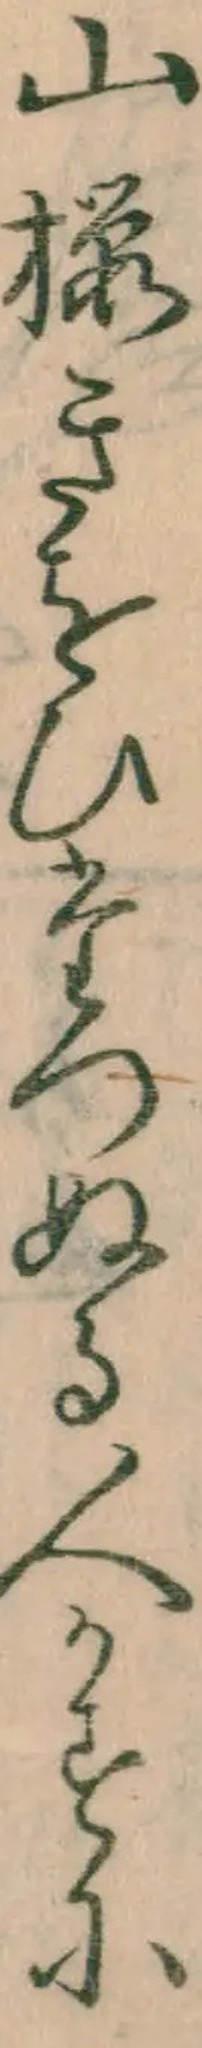山桜きをひたつぬる人かすに
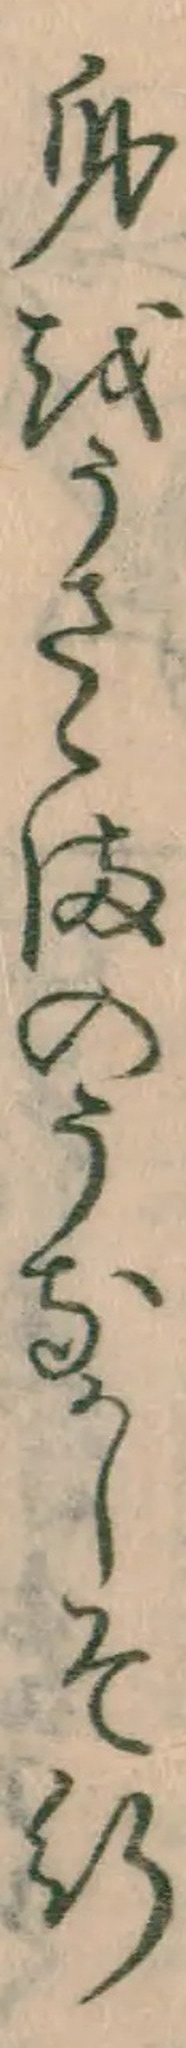身をうさゝまのうなかしそ行
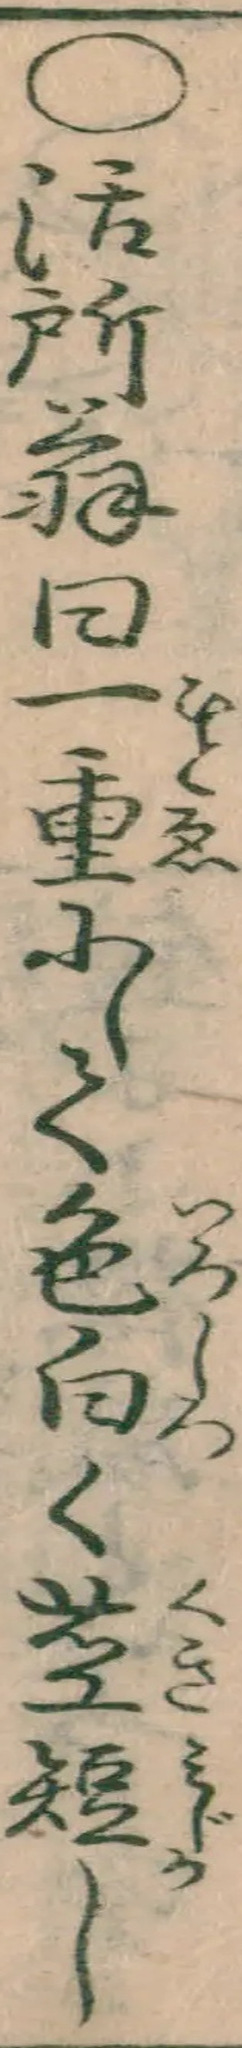○活所翁曰一重にして色白く茎短し
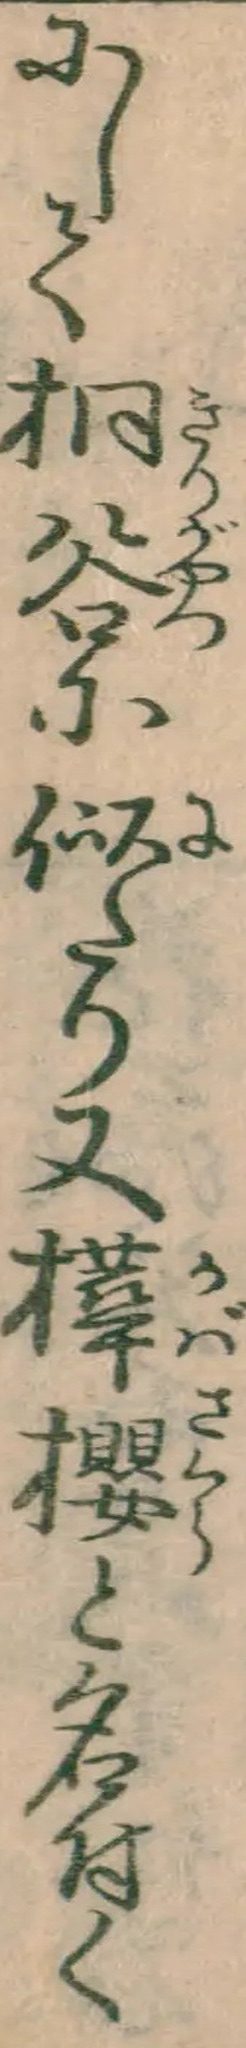にして桐谷に似たり又樺桜と名付く

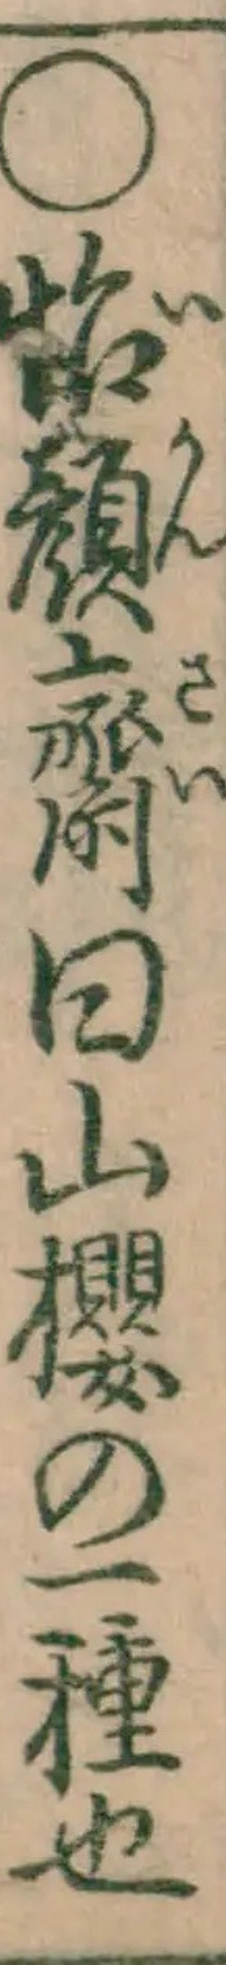○怡顔斎曰山桜の一種也
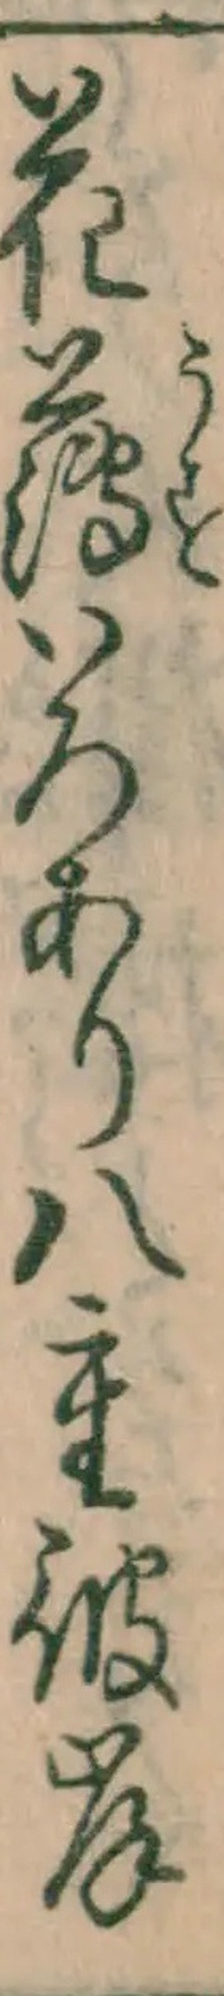花薄いろあり八重彼岸
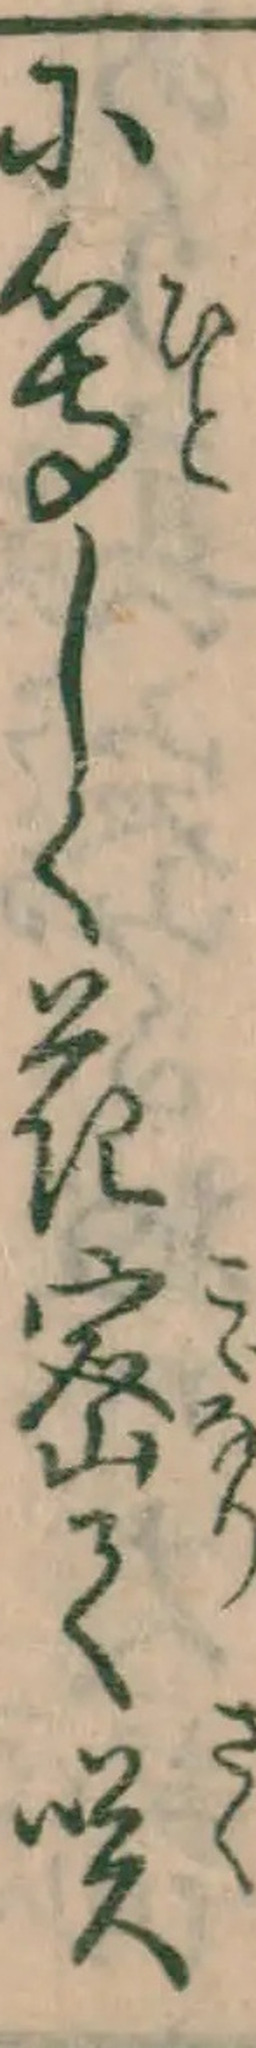に等しく花密て咲
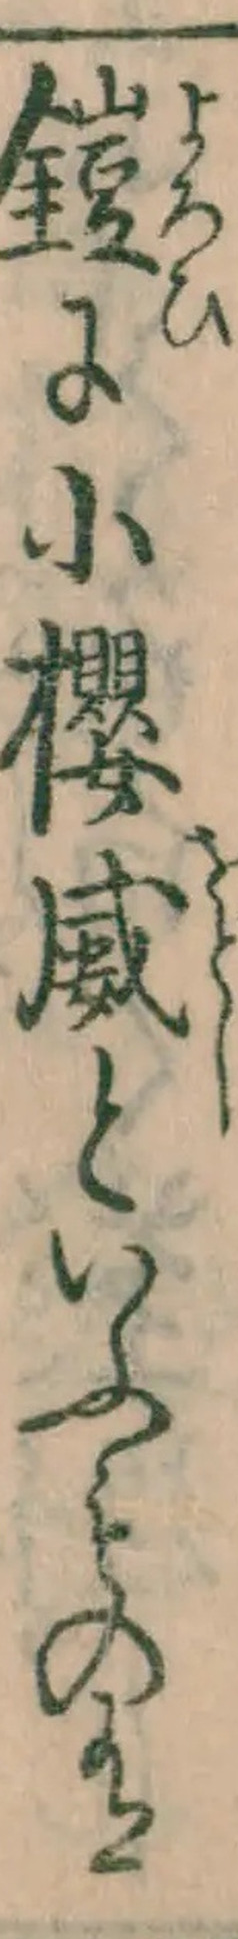鎧に小桜威といふもの有
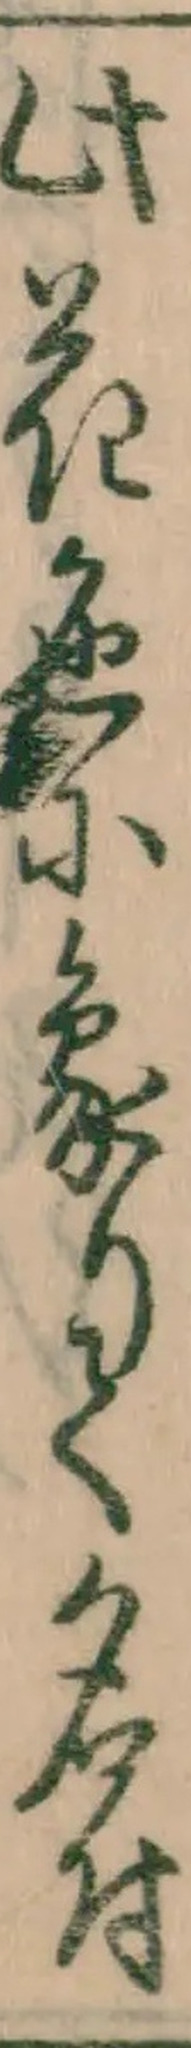此花色に象りて名付
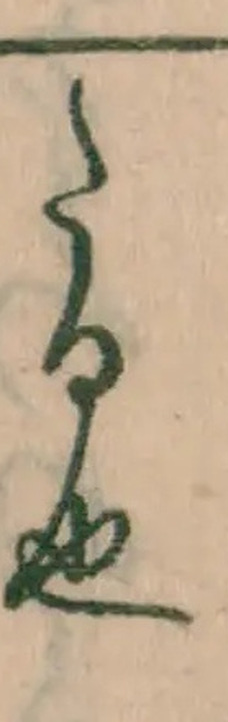たる也
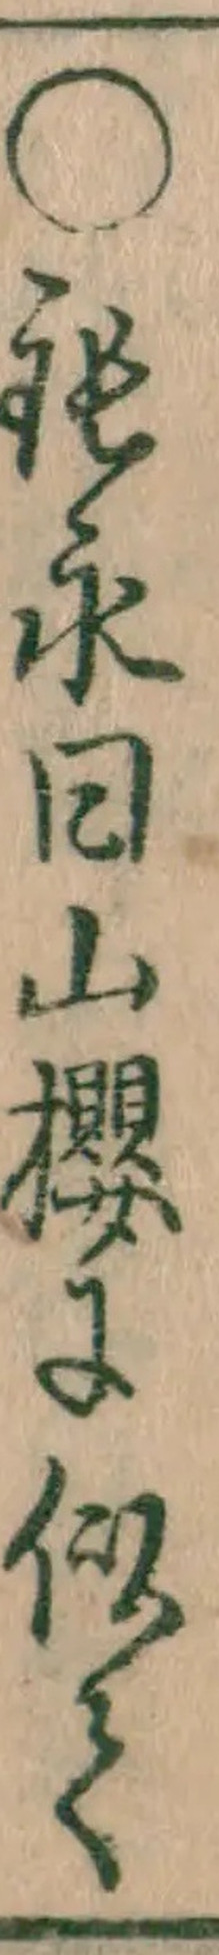○鈍永曰山桜に似て
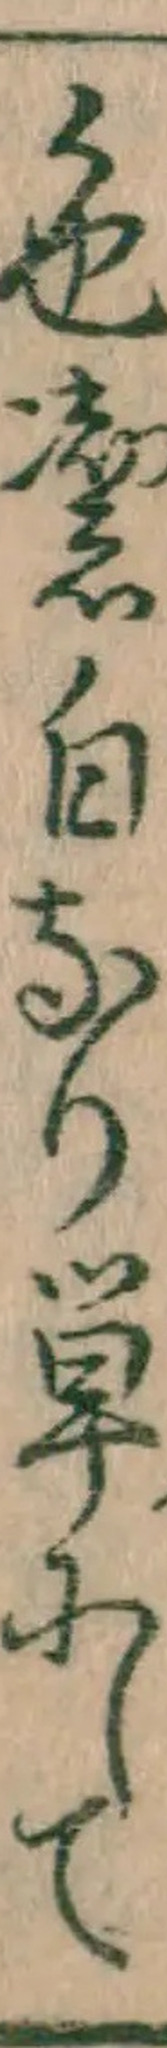色潔白なり単にして
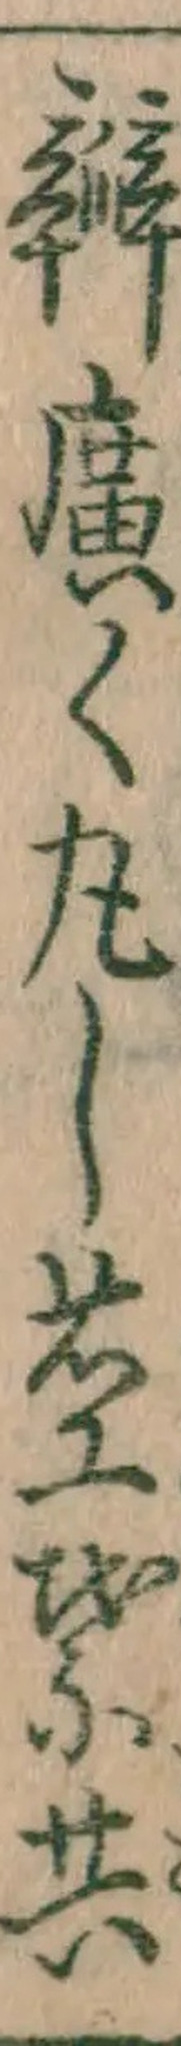弁広く丸し茎葉共
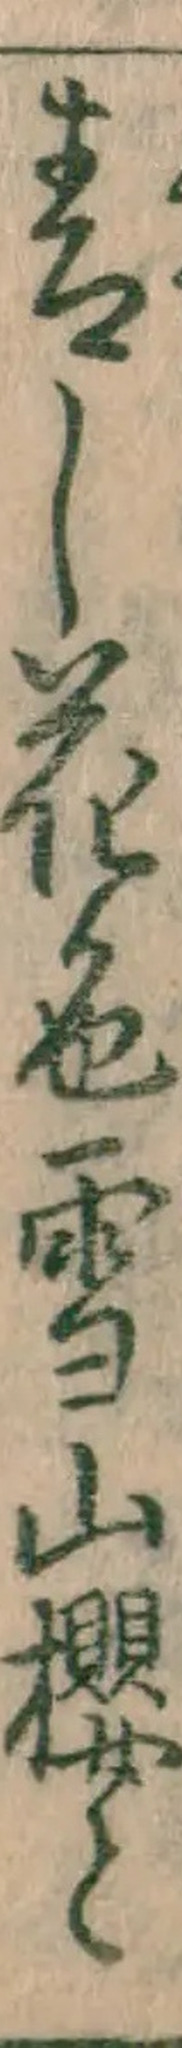青し花色雪山桜と
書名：怡顔齋櫻品
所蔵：国立国会図書館 National Diet Library, JAPAN
